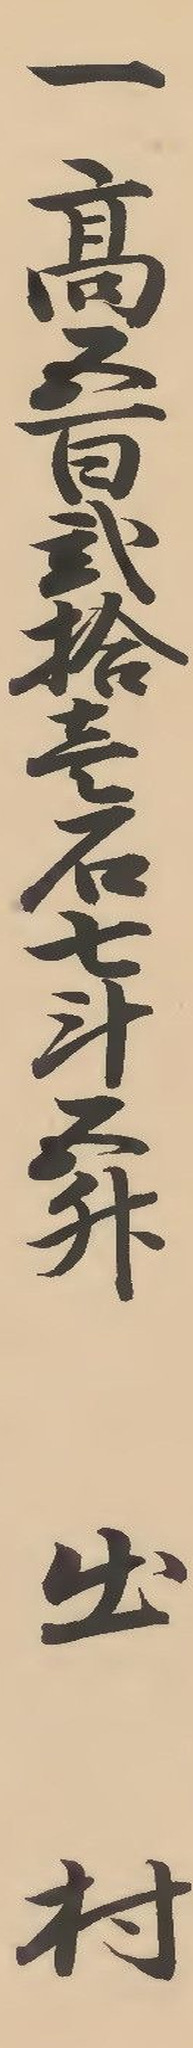一高五百弐拾壱石七斗五升出村
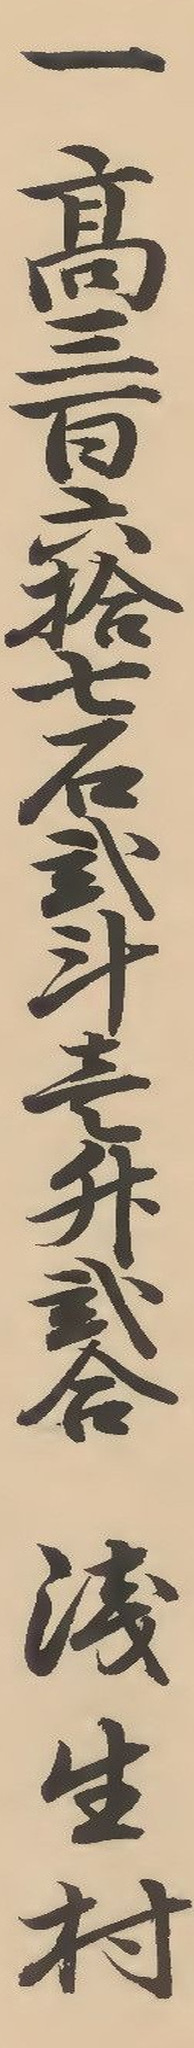一高三百六拾七石弐斗壱升弐合浅生村
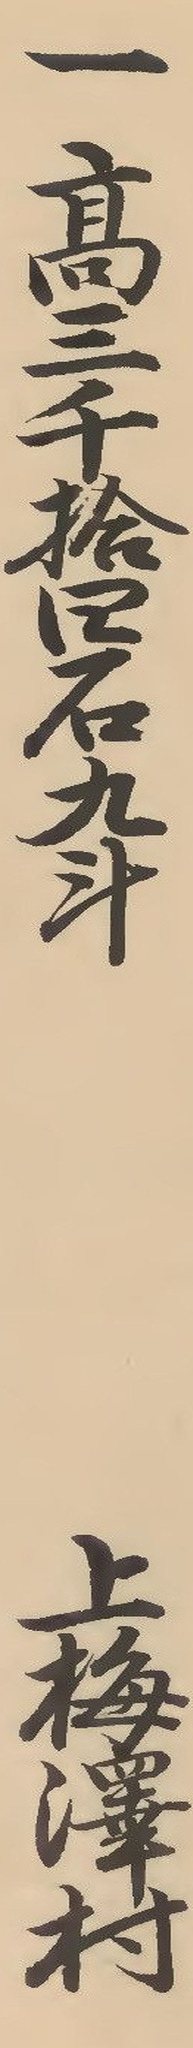一高三千拾四石九斗上梅沢村
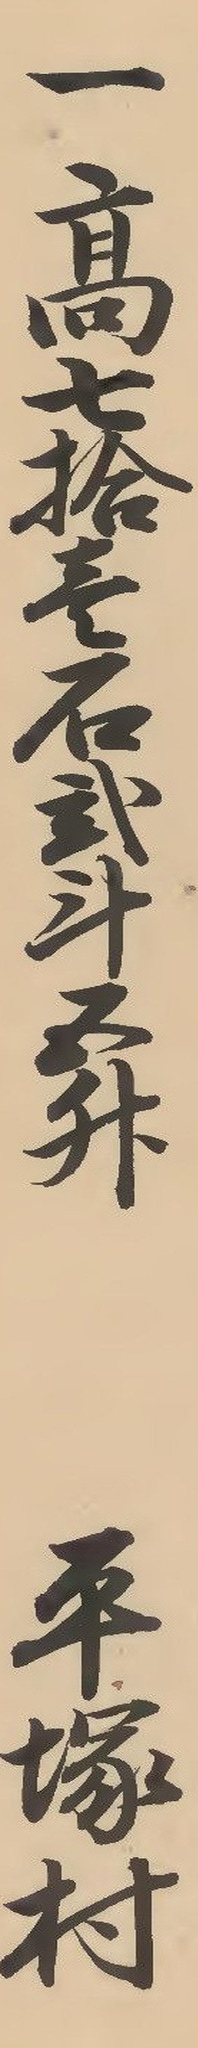一高七拾壱石弐斗五升平塚村

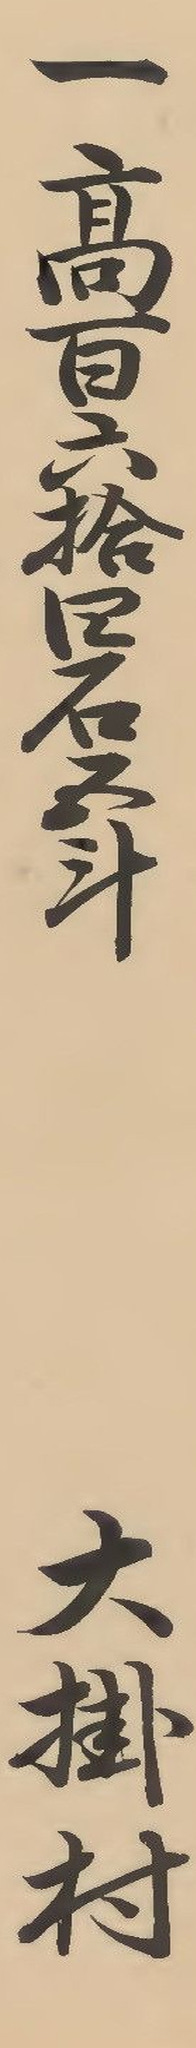一高百六拾四石五斗大掛村
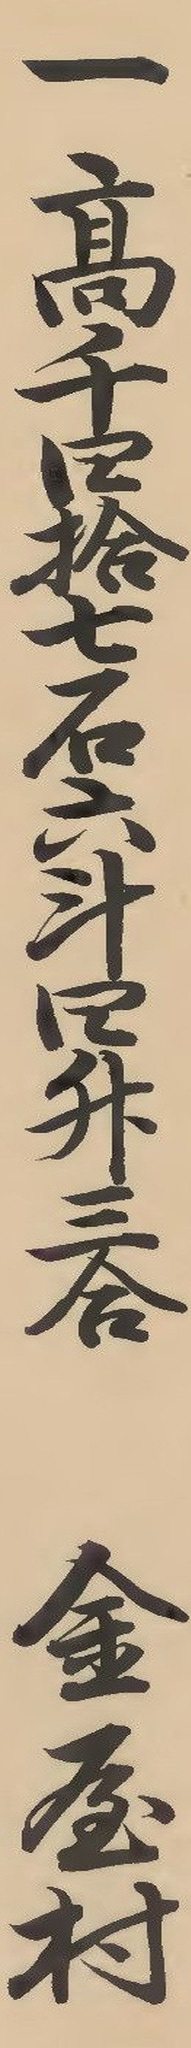一高千四拾七石六斗四升三合金屋村
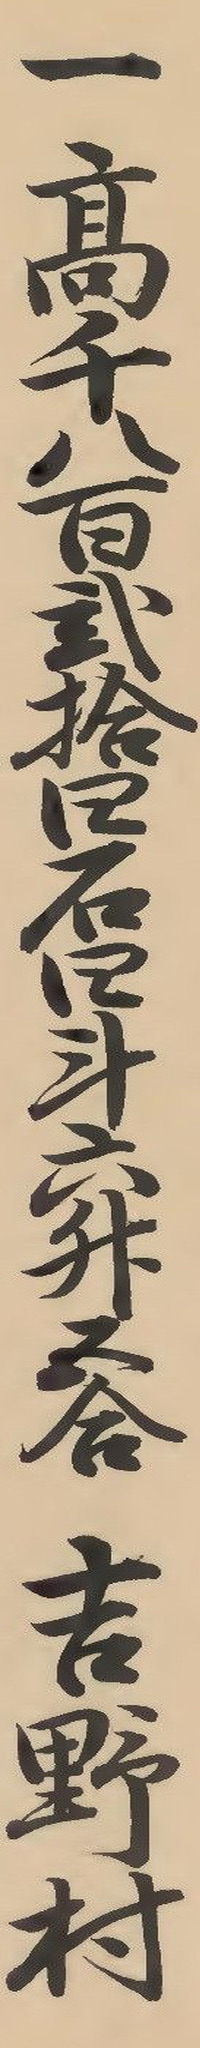一高千八百弐拾四石四斗六升五合吉野村
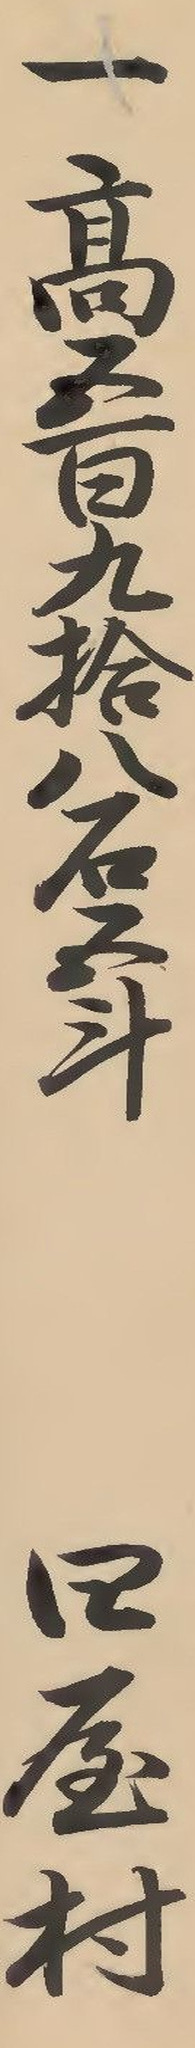一高五百九拾八石五斗四屋村
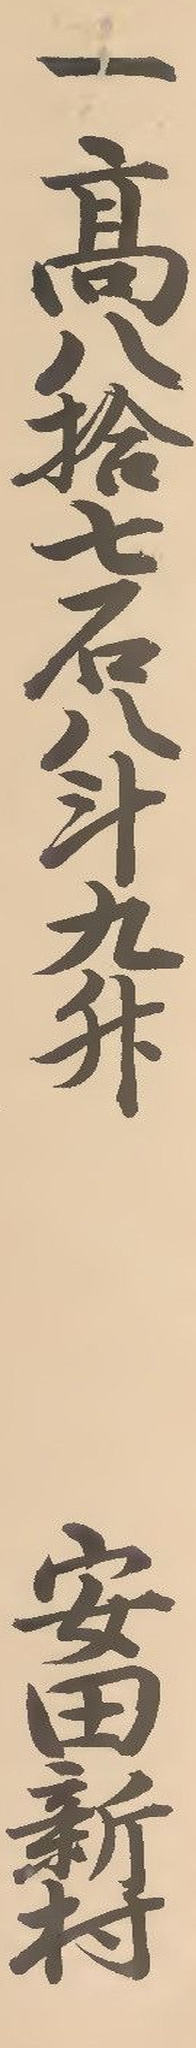一高八拾七石八斗九升安田新村
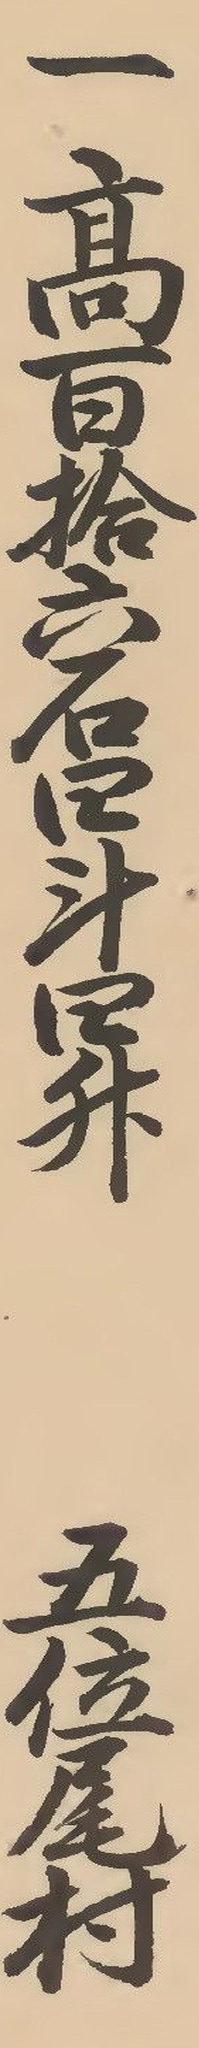一高百拾六石四斗四升五位尾村

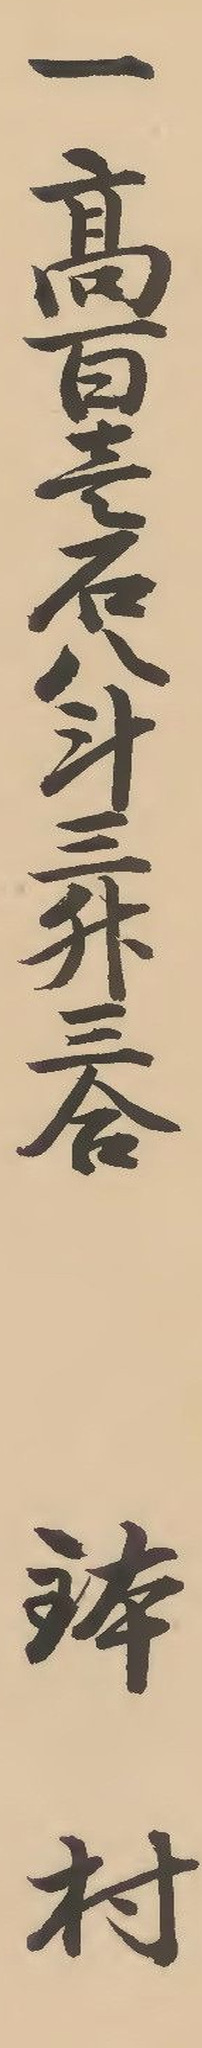一高百壱石八斗三升三合鉢村
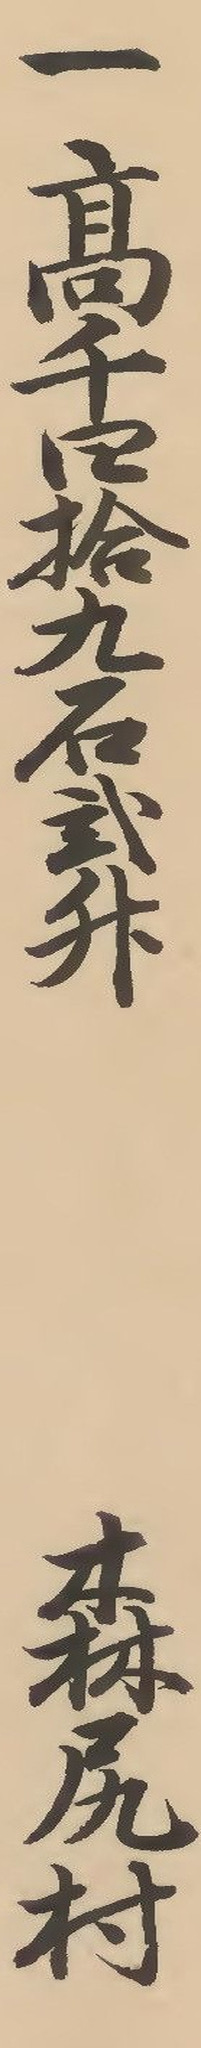一高千四拾九石弐升森尻村
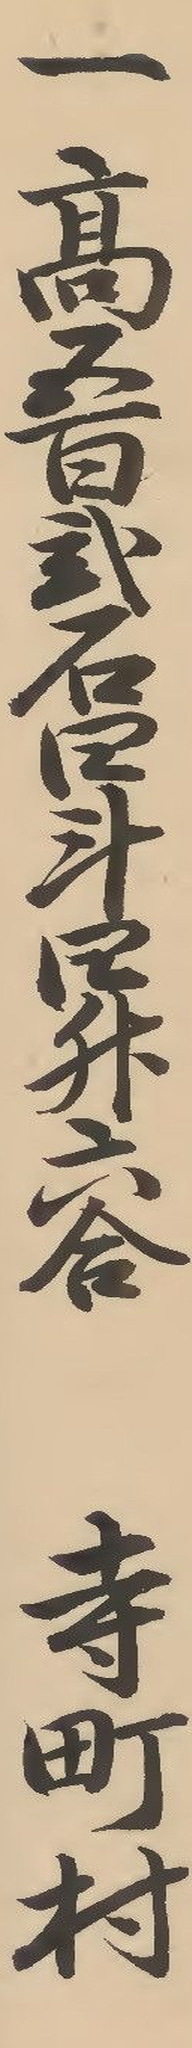一高五百弐石四斗四升六合寺町村
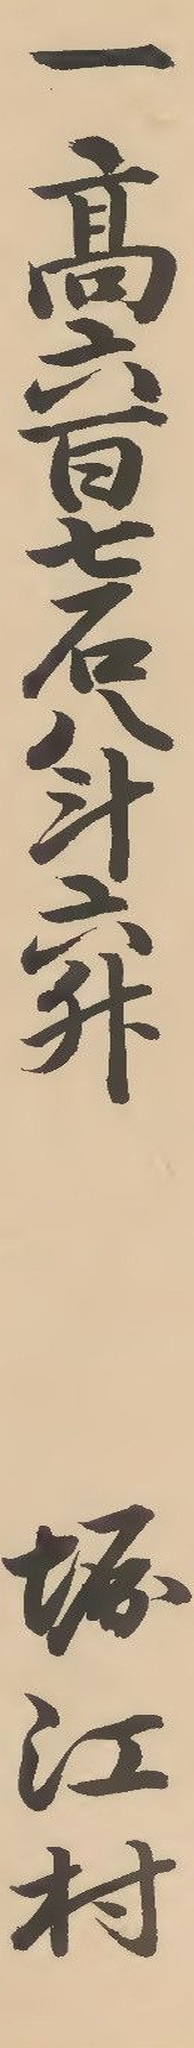一高六百七石八斗六升堀江村
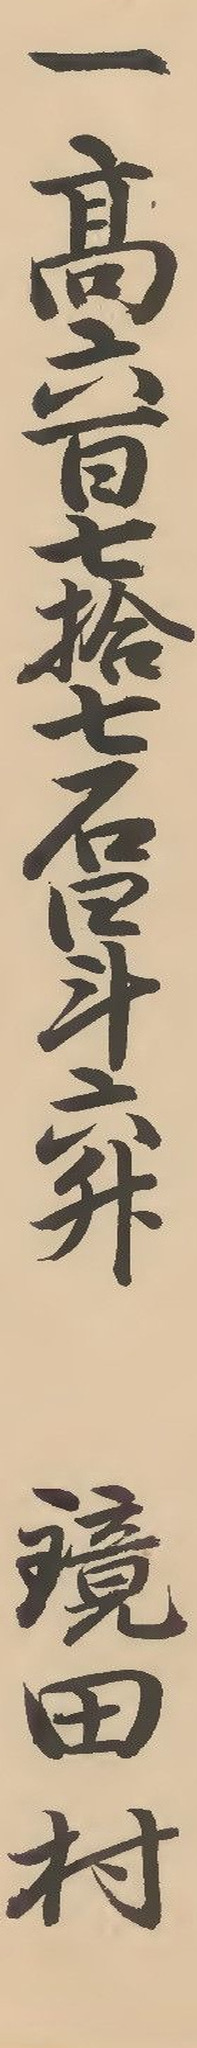一高六百七拾七石四斗六升鏡田村
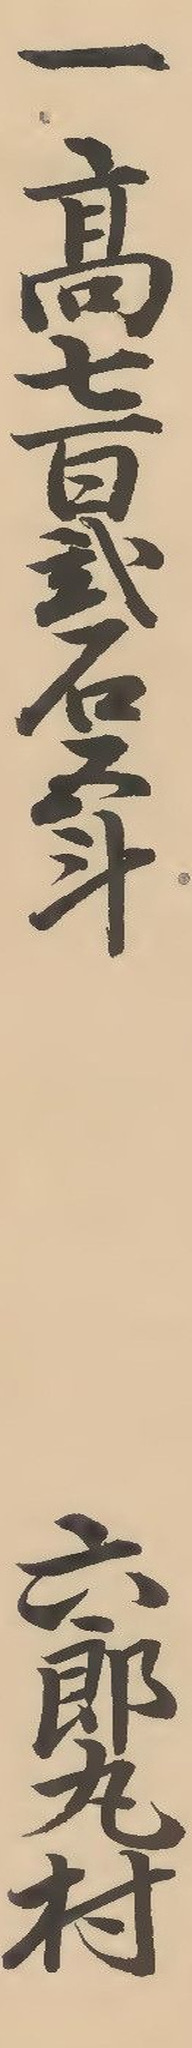一高七百弐石五斗六郎丸村
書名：越中国郷帳
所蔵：国立公文書館 National Archives of Japan
